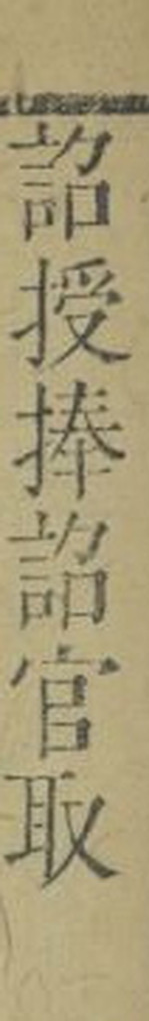詔授捧詔官取
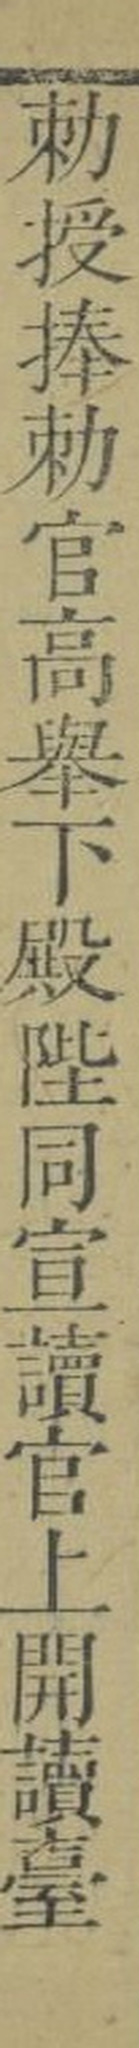勅授捧勅官高舉下殿陛同宣讀官上開讀臺
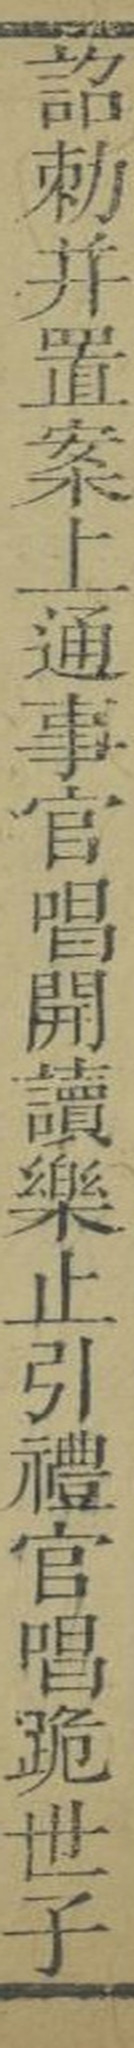詔勅并置案上通事官唱開讀樂止引禮官唱跪世子
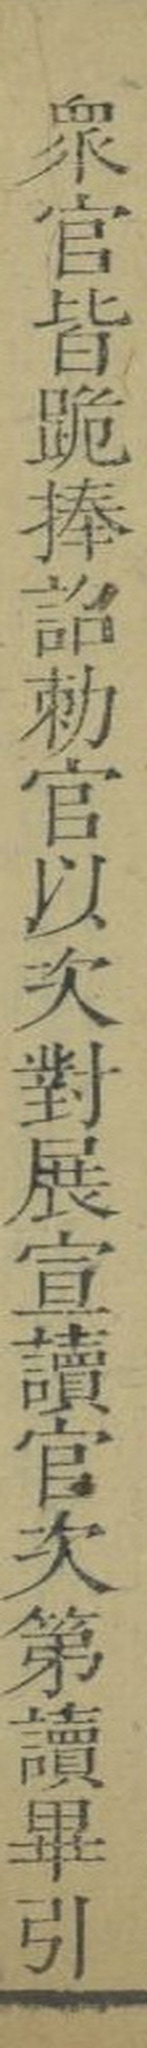衆官皆跪捧詔勅官以次對展宣讀官次第讀畢引
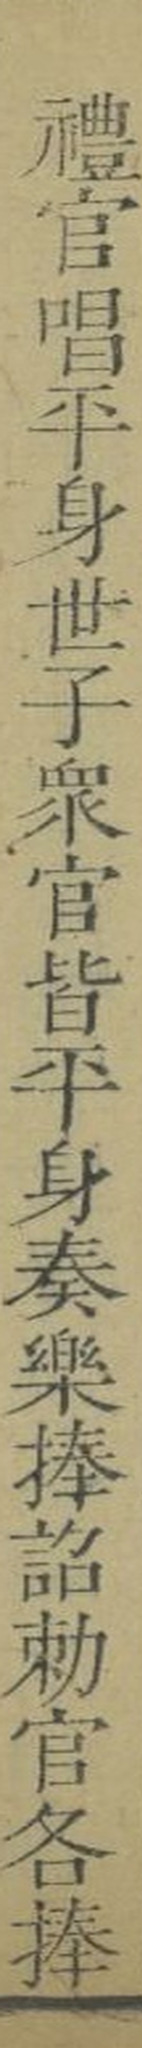禮官唱平身世子衆官皆平身奏樂捧詔勅官各捧
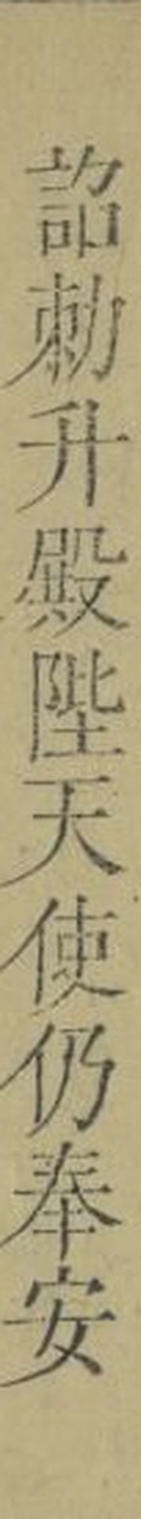詔勅升殿陛天使仍奉安
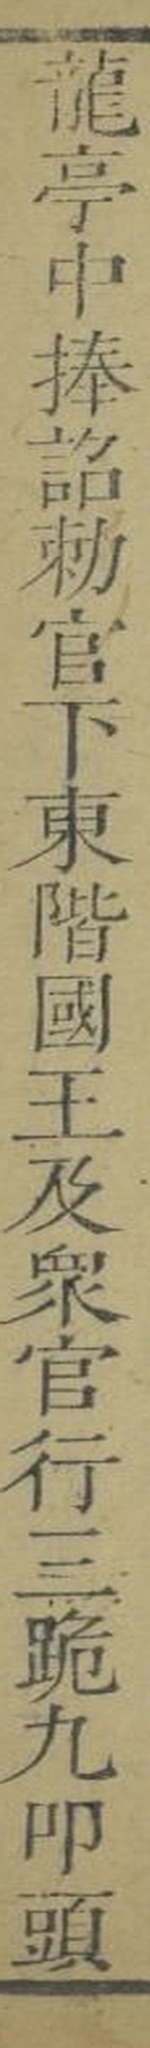龍亭中捧詔勅官下東階國王及衆官行三跪九叩頭
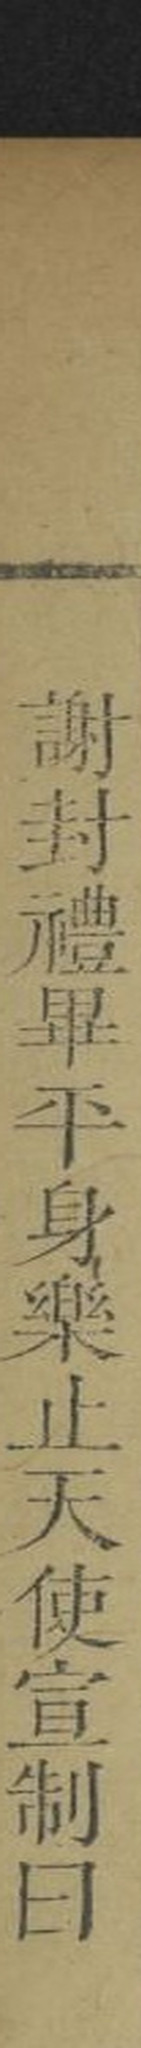謝封禮畢平身樂止天使宣制曰
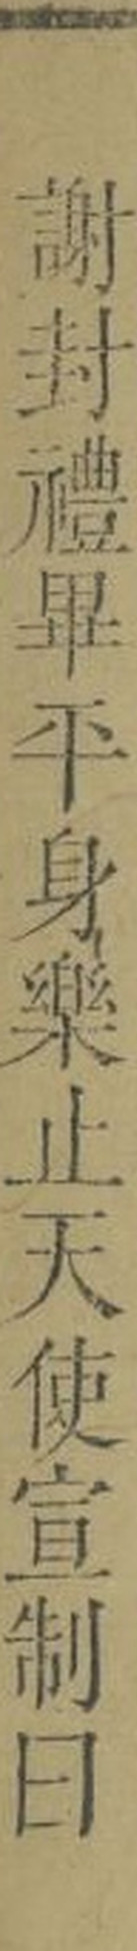謝封禮畢平身樂止天使宣制曰

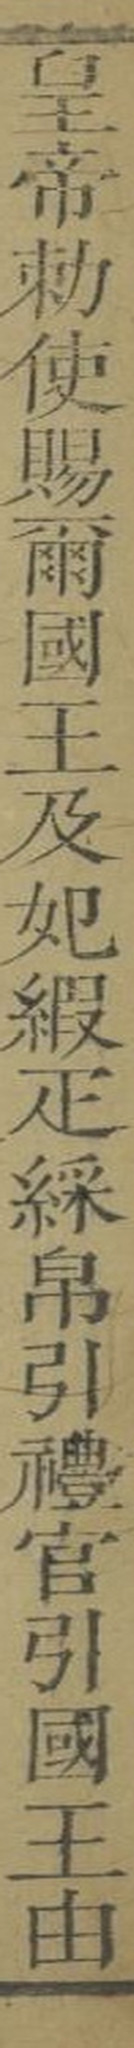皇帝勅使賜爾國王及妃縀疋綵帛引禮官引國王由
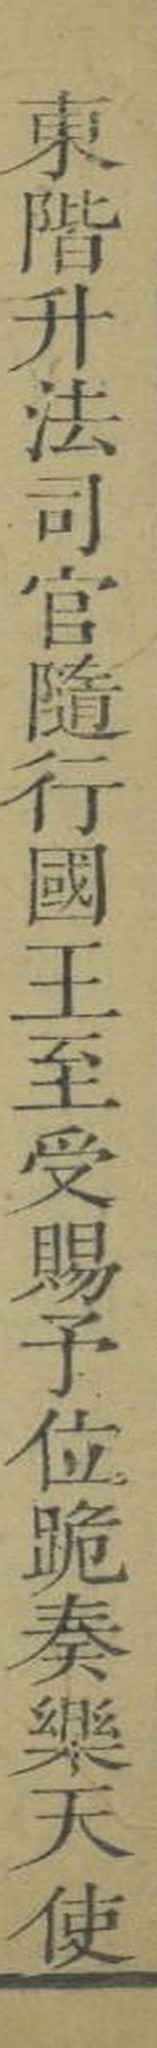東階升法司官隨行國王至受賜予位跪奏樂天使
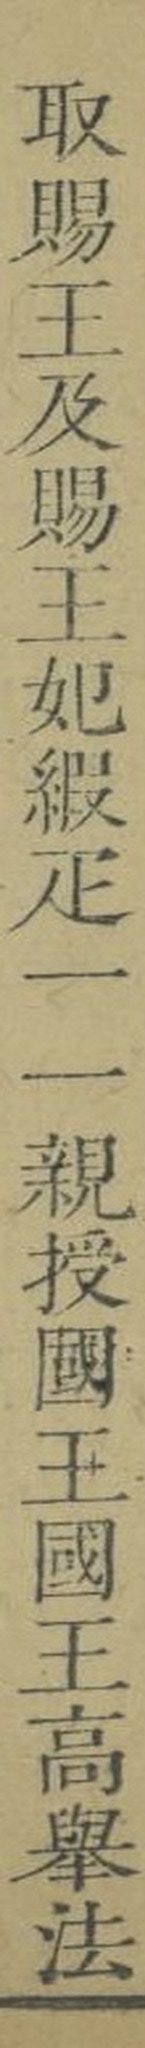取賜王及賜王妃縀疋一一親授國王國王高舉法
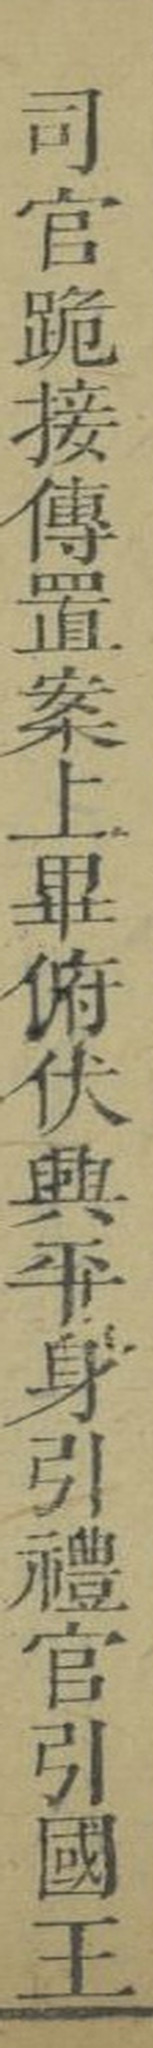司官跪接傳置案上畢俯伏興平身引禮官引國王
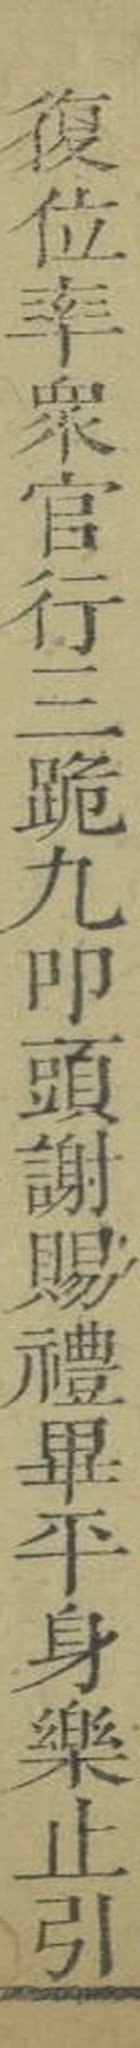復位率衆官行三跪九叩頭謝賜禮畢平身樂止引
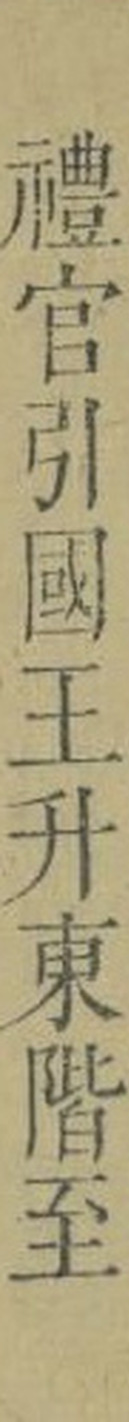禮官引國王升東階至
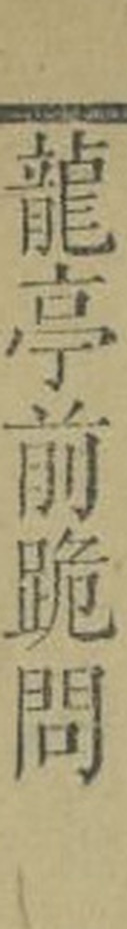龍亭前跪問
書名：中山伝信録 巻二
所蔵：University of the Ryukyus Library
